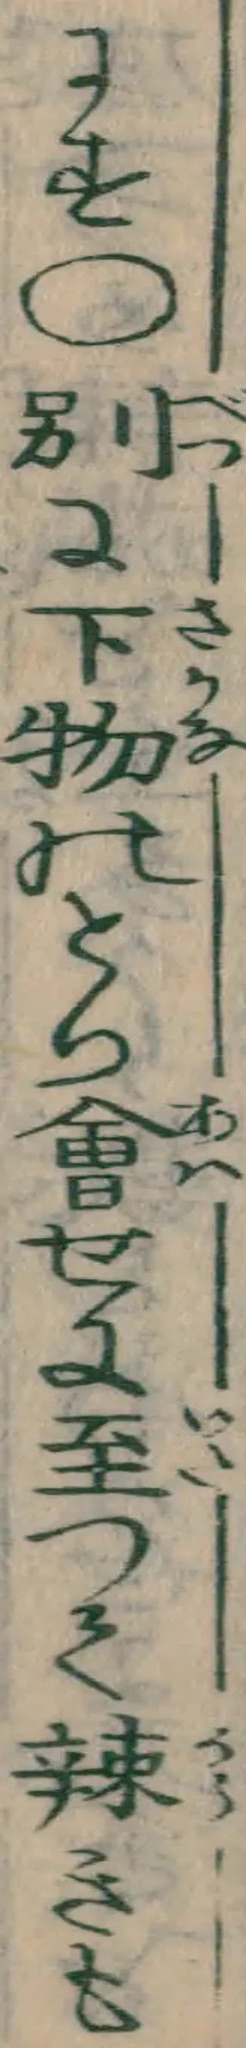にす○別に下物のとり会せに至つて辣きも
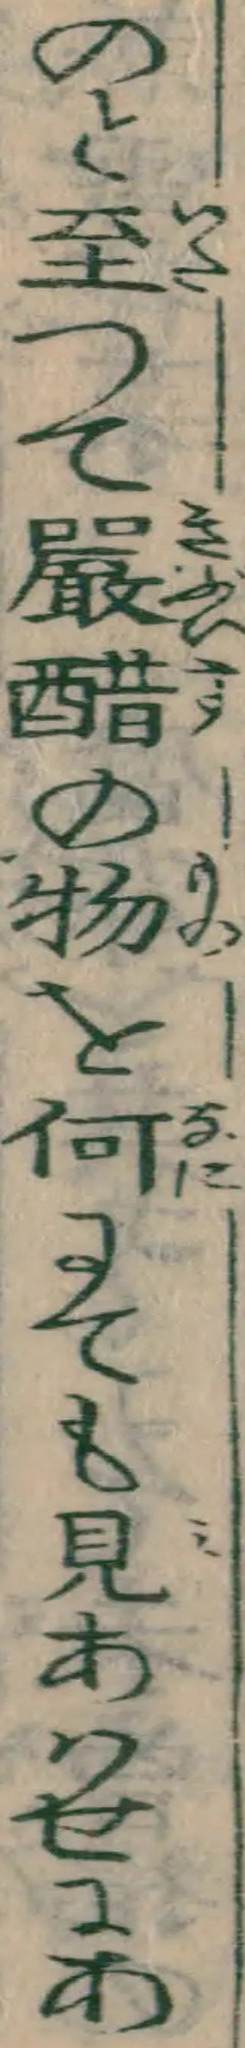のと至つて厳醋の物を何にても見あはせにあ
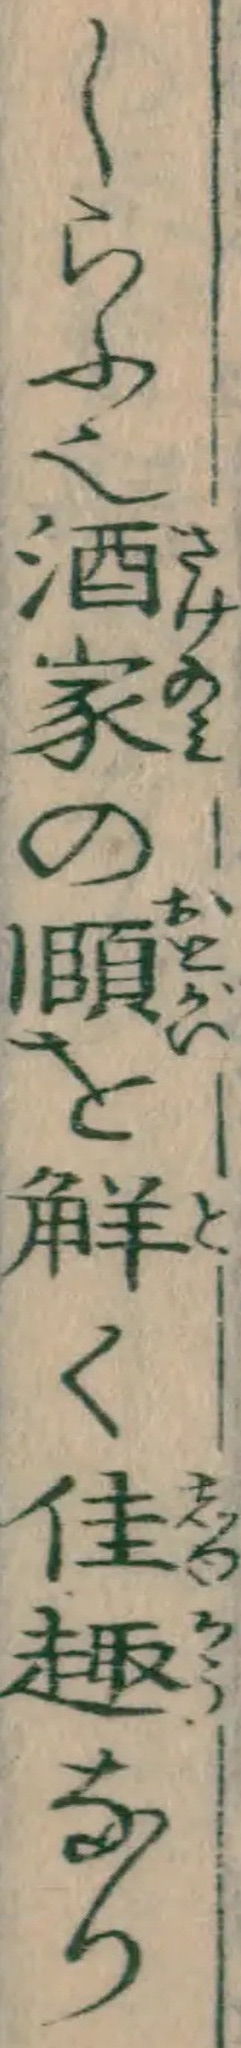しらふ也酒家の頤を解く佳趣なり
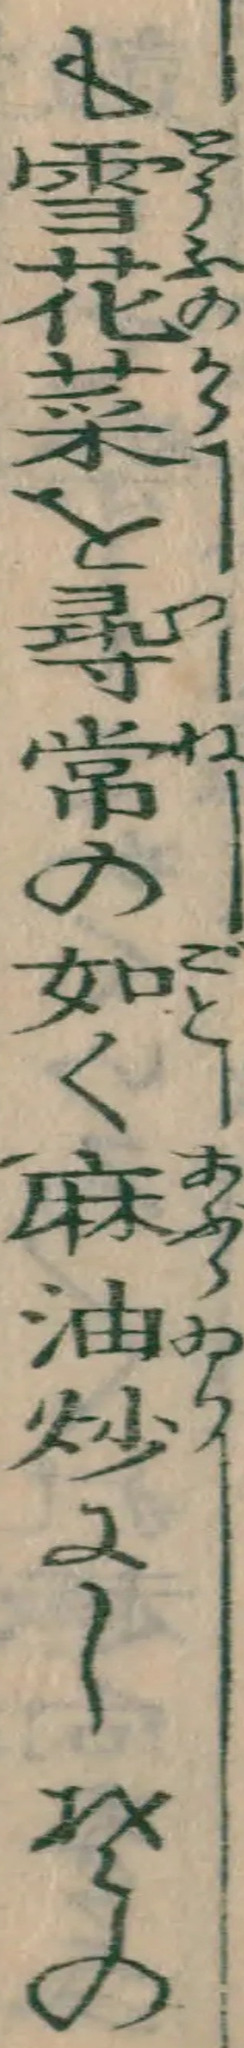も雪花菜を尋常の如く麻油炒にしその
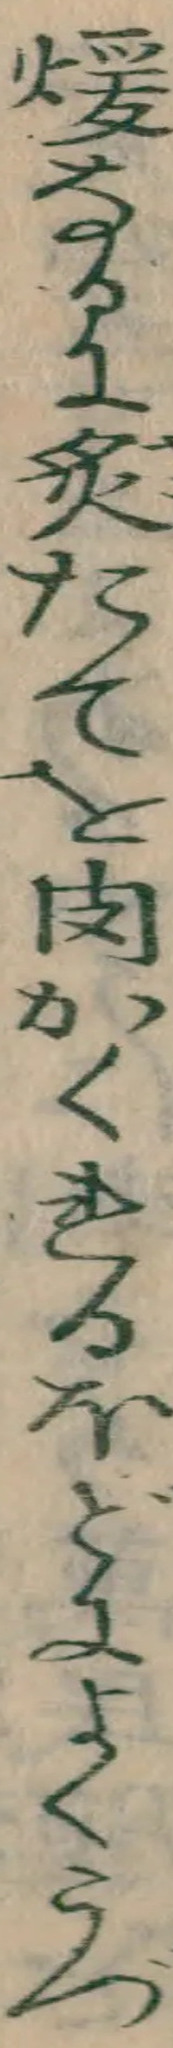煖なるに炙たてを肉かくれるほどによくうづ
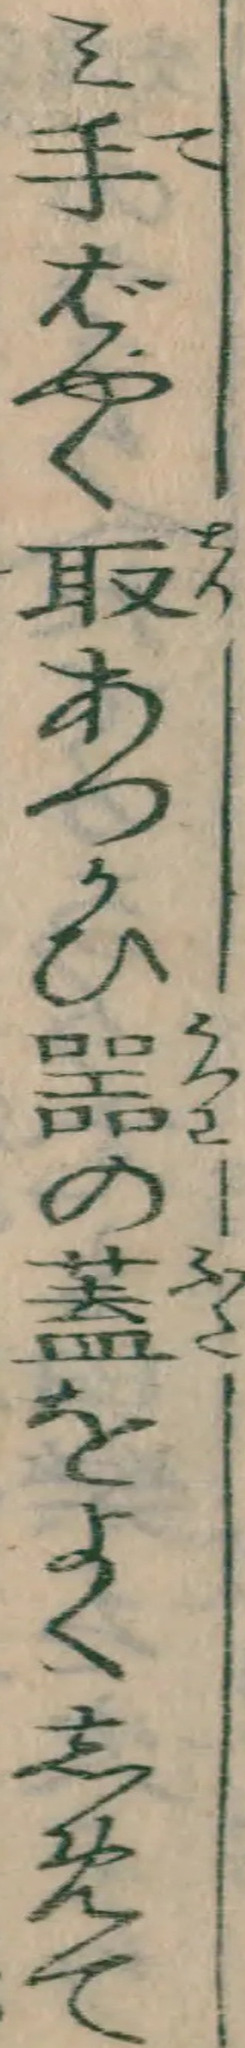み手ばやく取あつかひ器の蓋をよくしめて
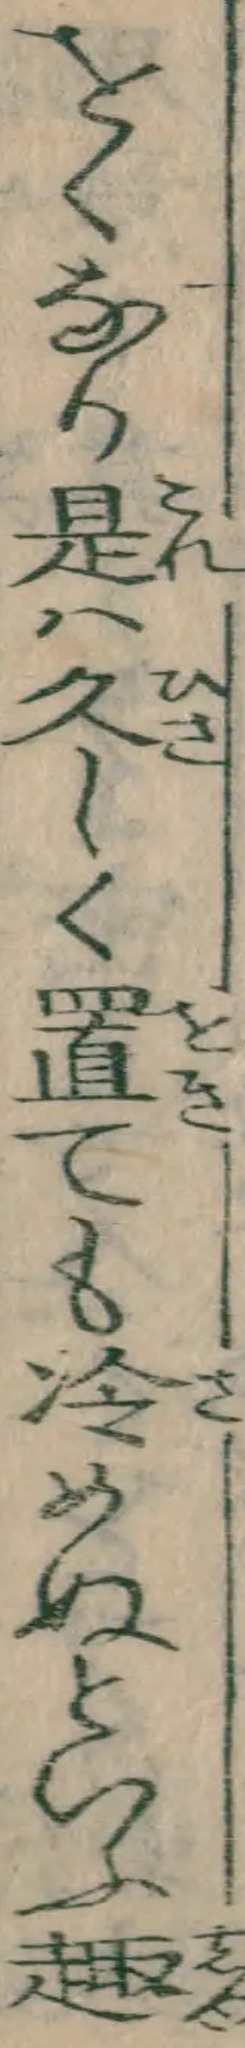をくなり是は久しく置ても冷めぬといふ趣
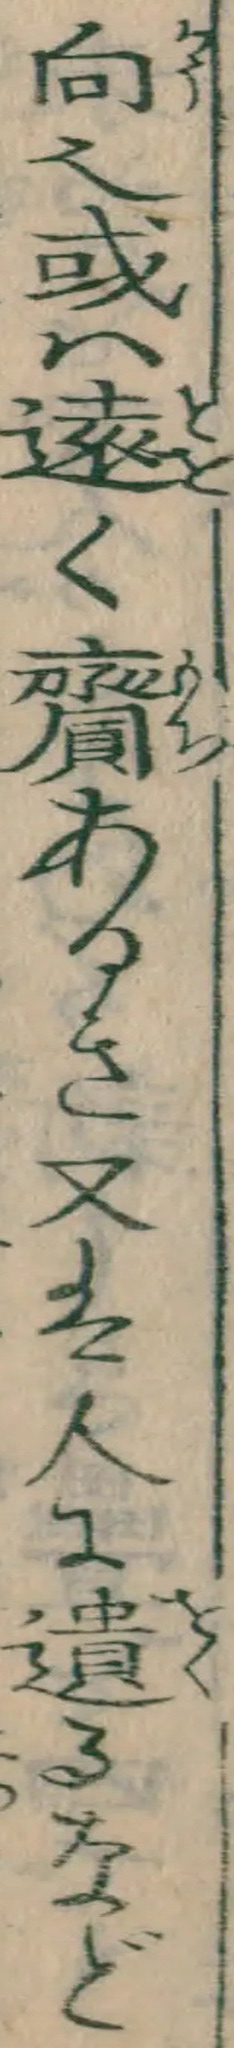向也或は遠く齎あるき又は人に遺るなど
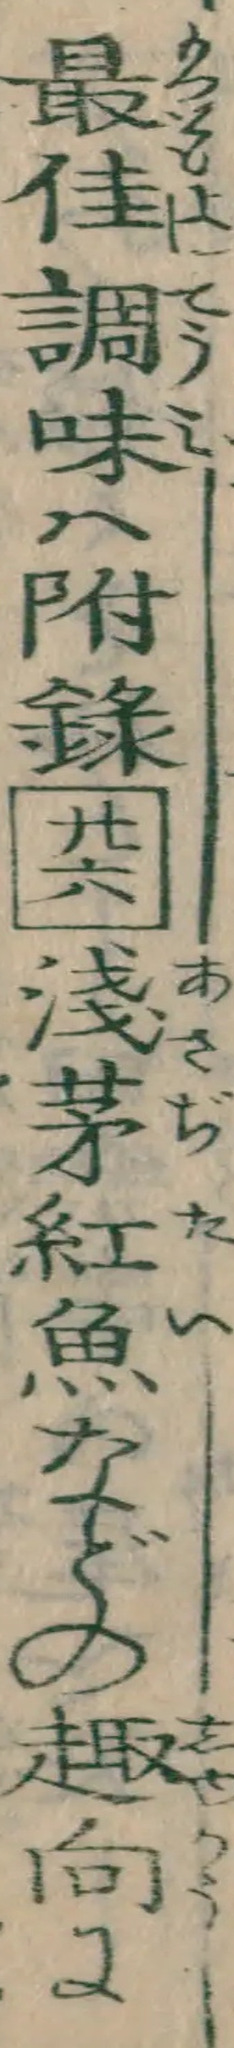最佳調味は附録廿六浅茅紅魚などの趣向に
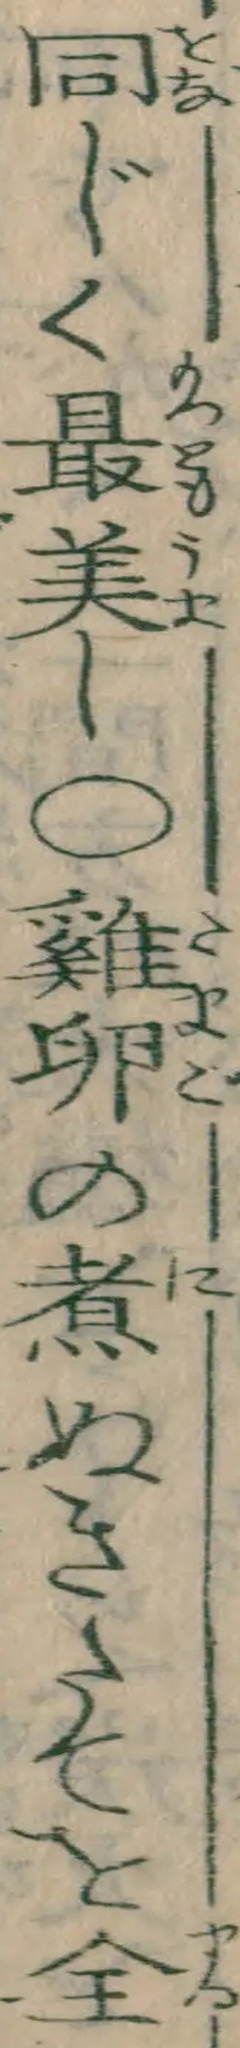同じく最美し○鶏卵の煮ぬきたてを全
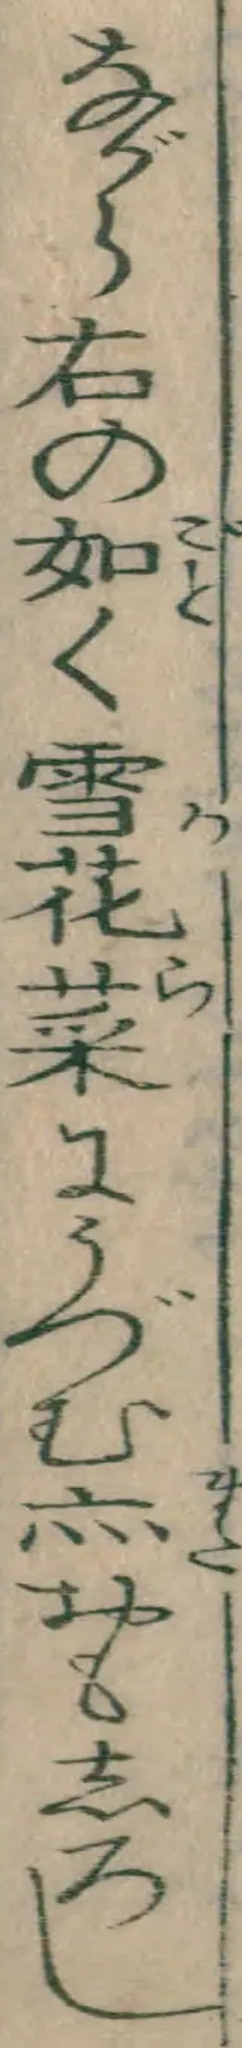ながら右の如く雪花菜にうづむ亦おもしろし

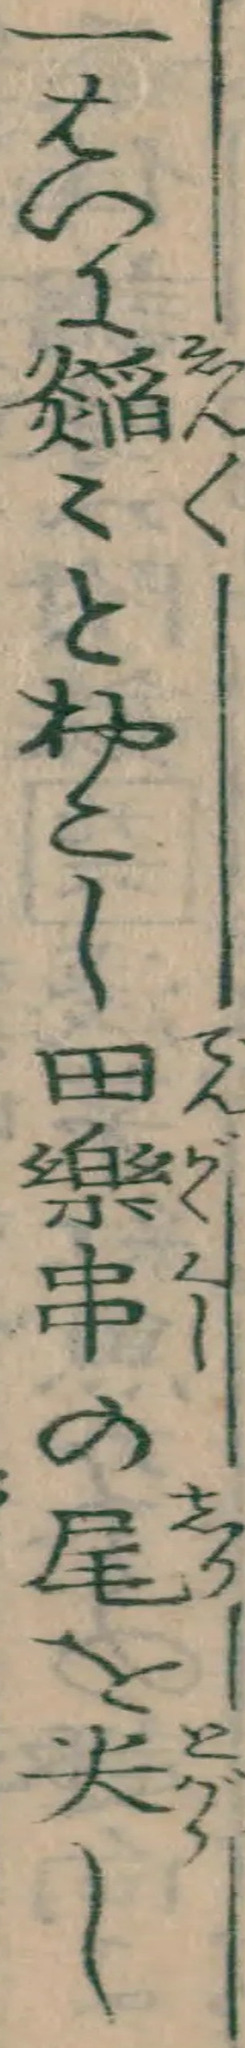一はいに焔々とおこし田楽串の尾を尖し
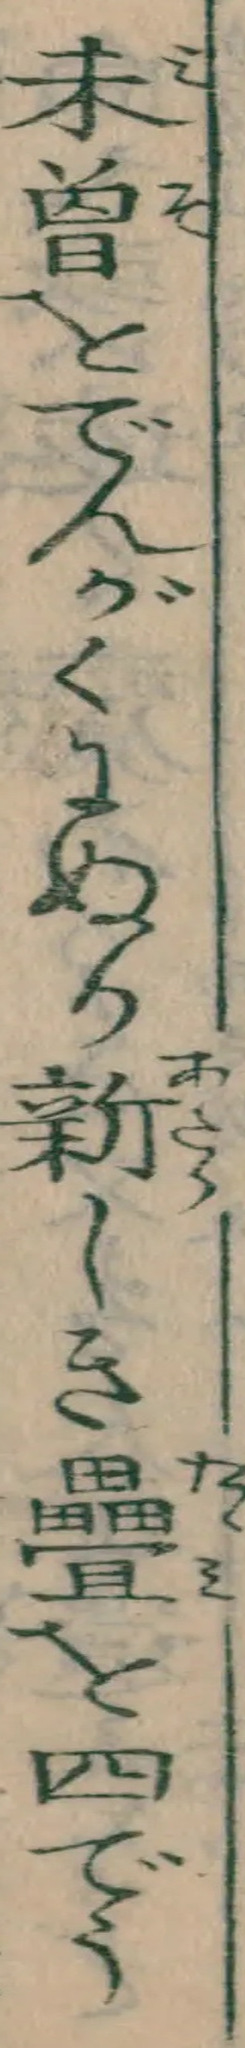未曽をでんがくにぬり新しき畳を四でう
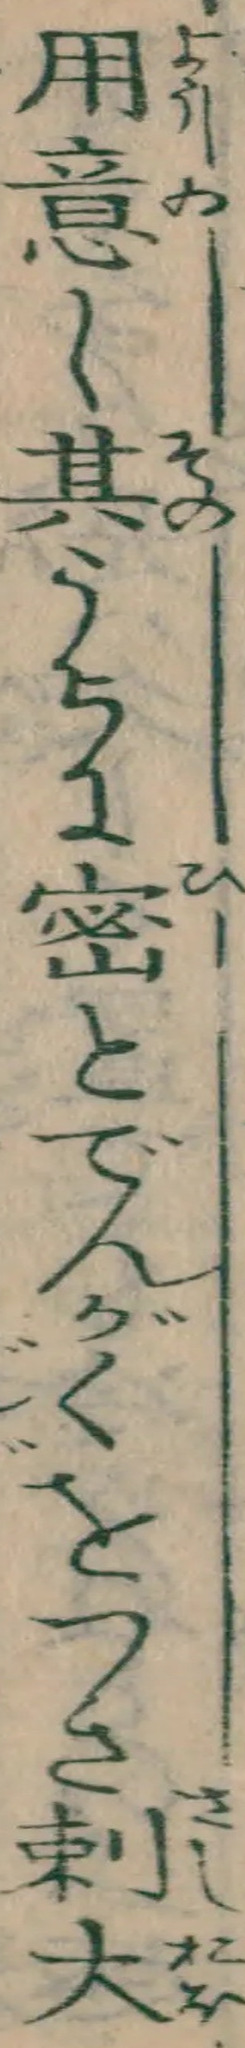用意し其うちに密とでんがくをつき刺大
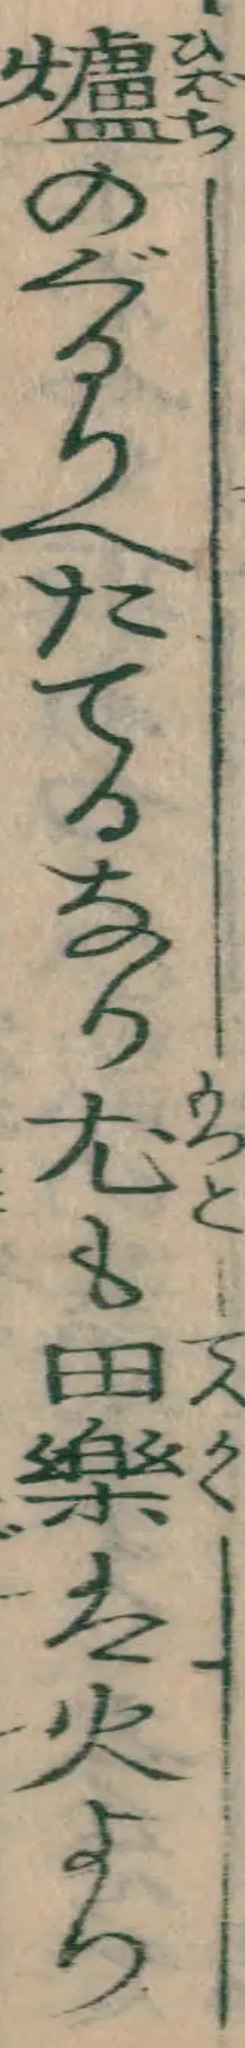炉のぐるりへたてるなり尤も田楽は火より
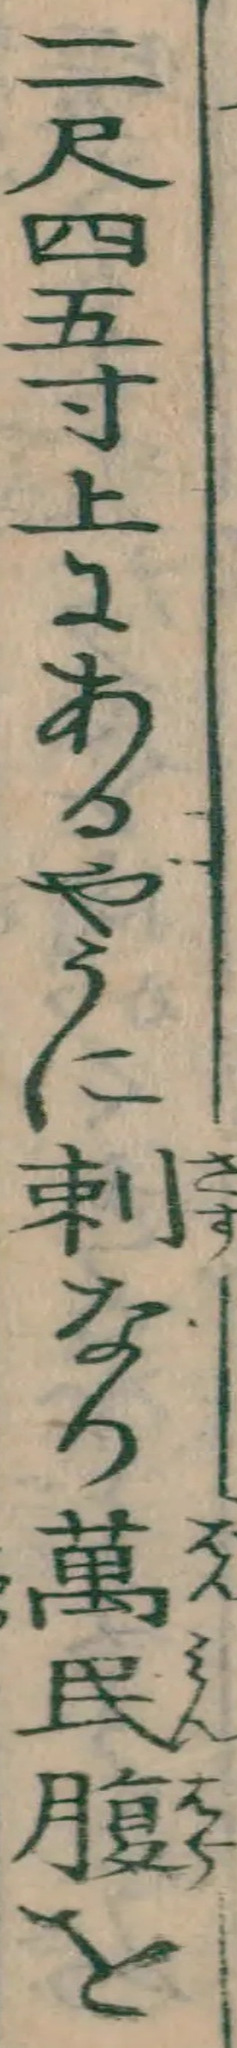二尺四五寸上にあるやうに刺なり万民腹を
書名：豆腐百珍. 続編
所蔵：国立国会図書館 National Diet Library, JAPAN
